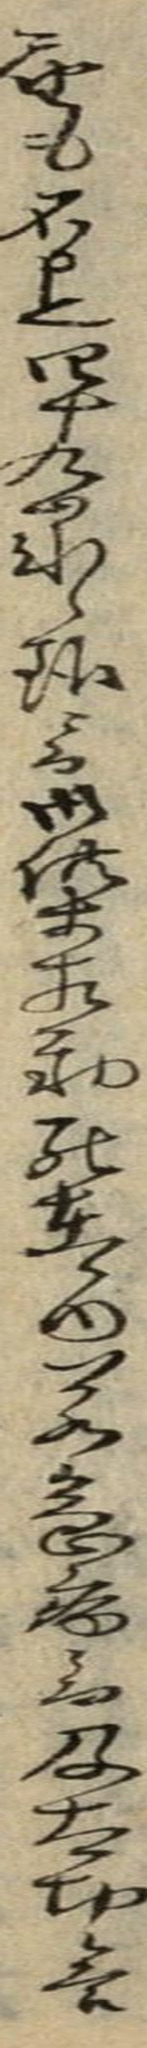届も不申上四十九歳之趣ニ而御供等相勤罷在候内若急病ニ而及太切候節
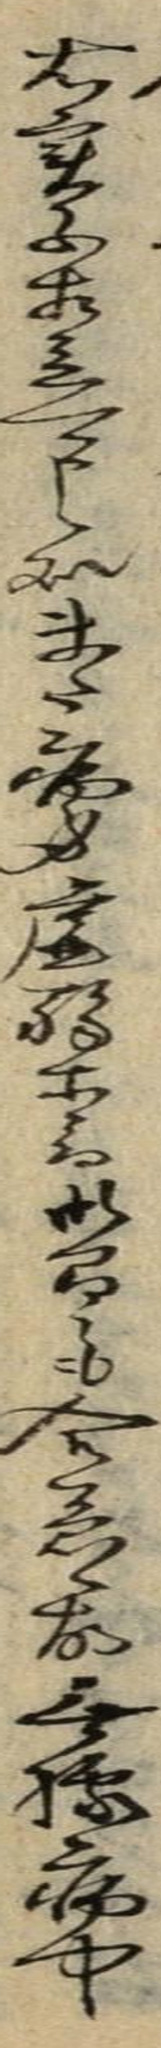右実子相立可申候処また病身虚弱等ニ而御間ニも合兼候故無拠病中
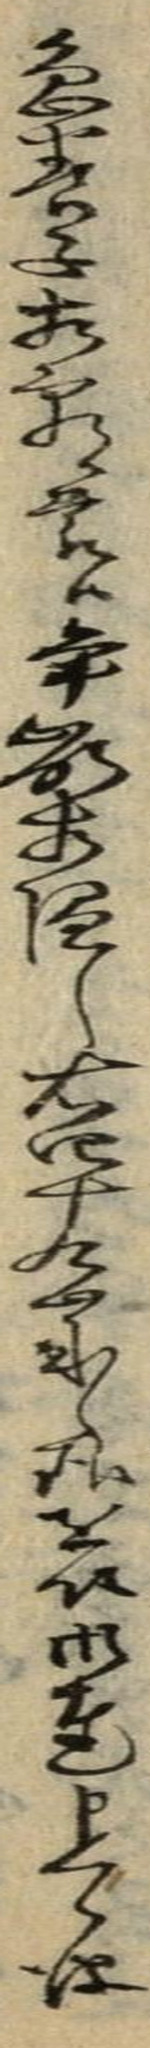急養子相願候節ハ年齢相隠し右四十九歳之趣を以御達申上候儀
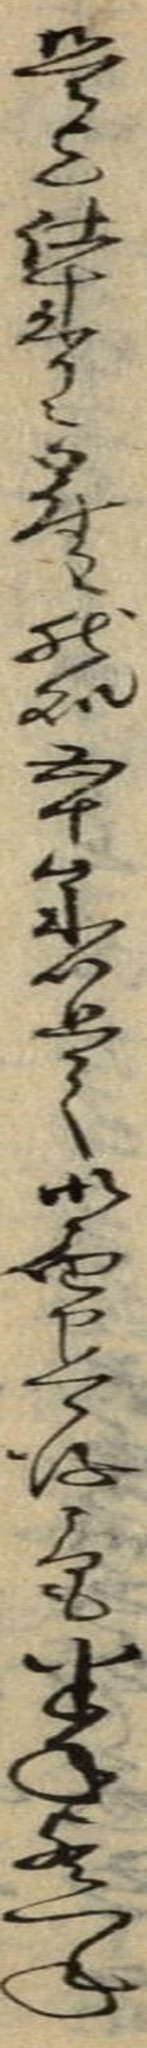是迄仕来りニ御座候然処五十歳以上之御届申上候後ニ而も半年歟一年
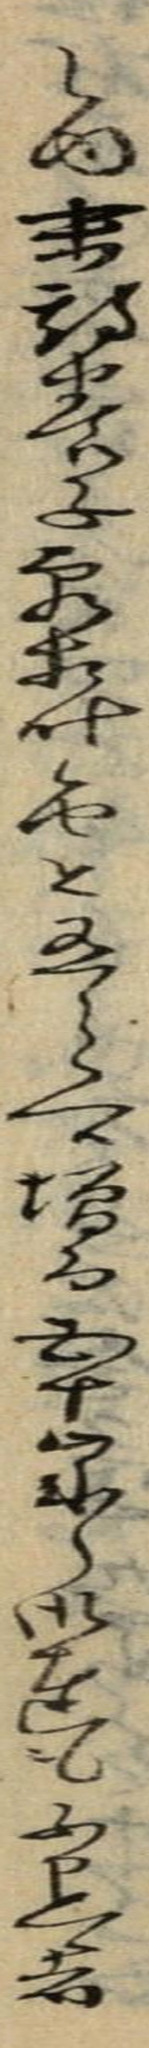之内末期養子願相叶候由と有之候へハ増而五十歳之御達も不申上候者
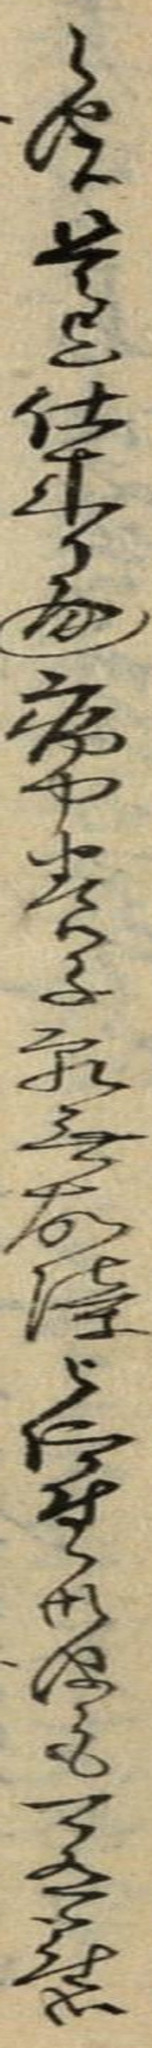之儀ハ是迄仕来り通病中養子願無故障被仰付候御儀ニも可有御座哉
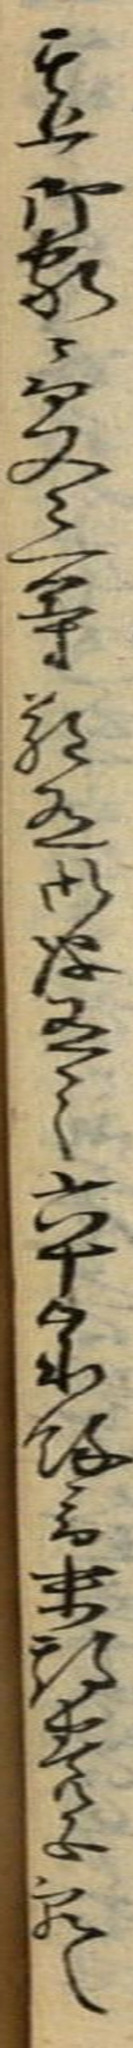其上御家ニ而又々一等難有御儀有之六十歳余ニ而末期養子願之
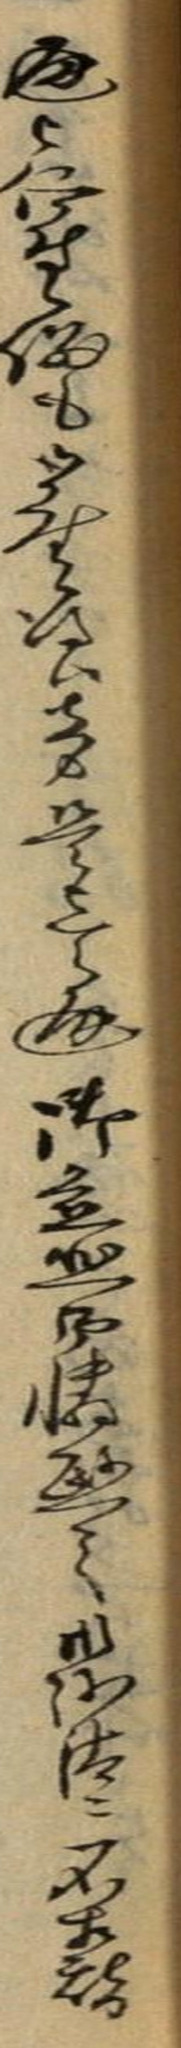通被仰付候儀も御座候得ハ旁是迄之通御慈悲御憐愍之御沙汰ニ不相替
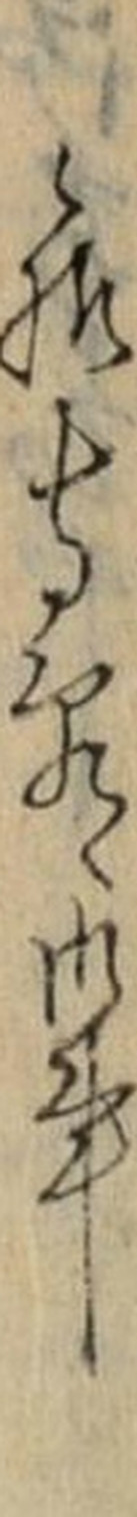候様奉願候御事
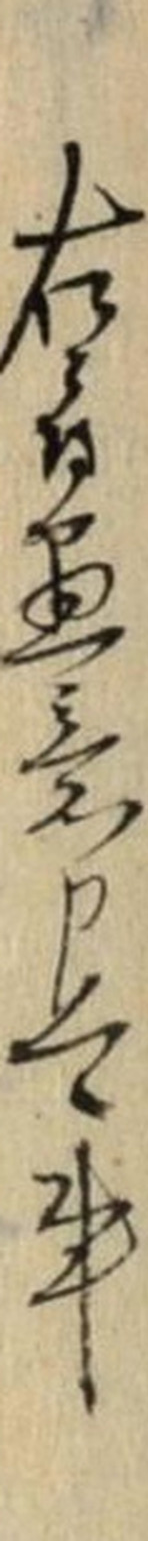右ニ付愚意申上候事
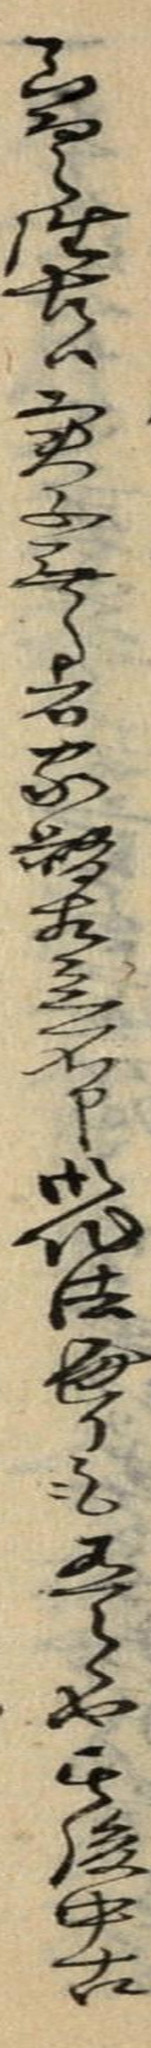而之往古ハ実子無之候者家督相立不申御作法通りニも有之候由其後中古
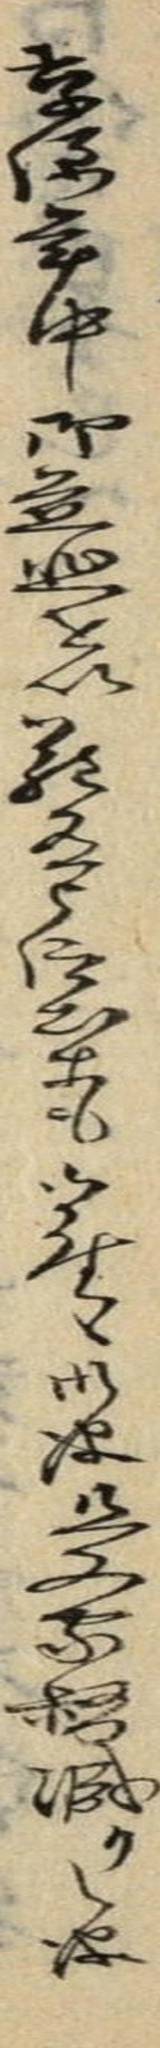享保年中御慈悲を以難有被仰出等も御座候御儀且又家督減り之儀
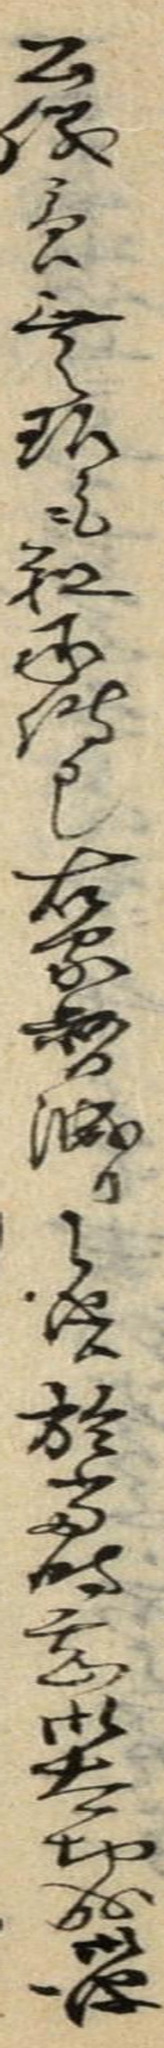公儀ニ而無之趣ニも粗承伝申候右家督減り之儀ハ於当時甚御太切成御儀
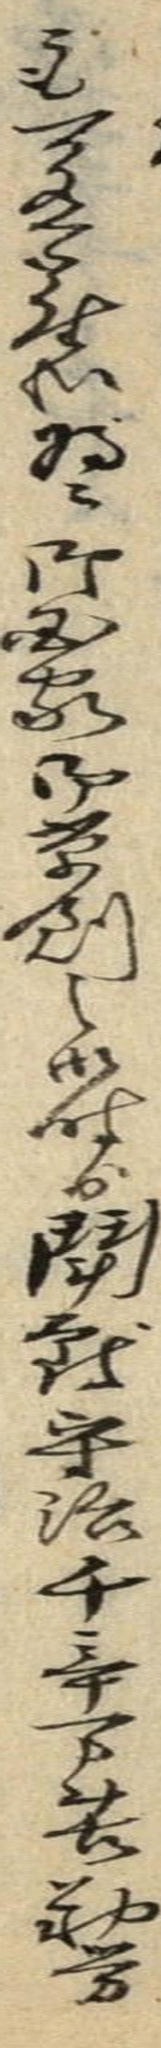ニも可有御座哉為ニ御国家御草創之御時ゟ闘対守治千辛万苦勤労
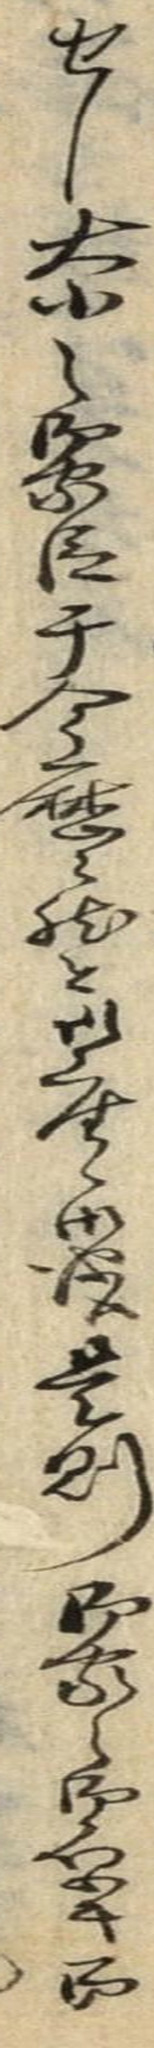せし大小之御家臣于今歴々然と御座候御儀ハ是則御家之御厚キ御
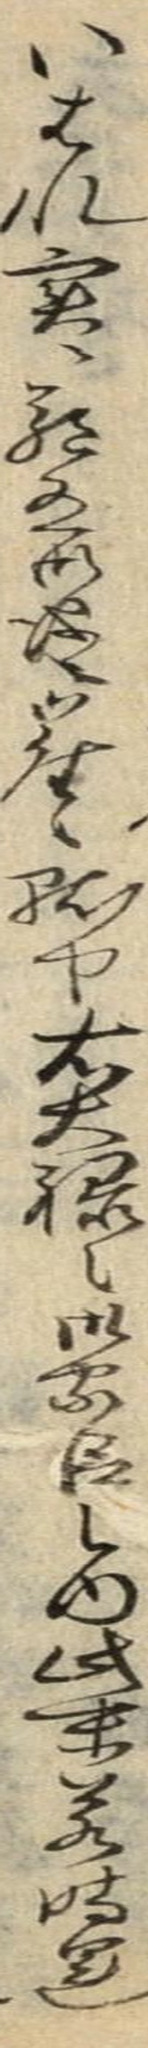いはれ実ニ難有御儀ニ御座候就中右大禄之御家臣之内此末若時運
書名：養子縁組之部
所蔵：福井県文書館 Fukui Prefectural Archives
